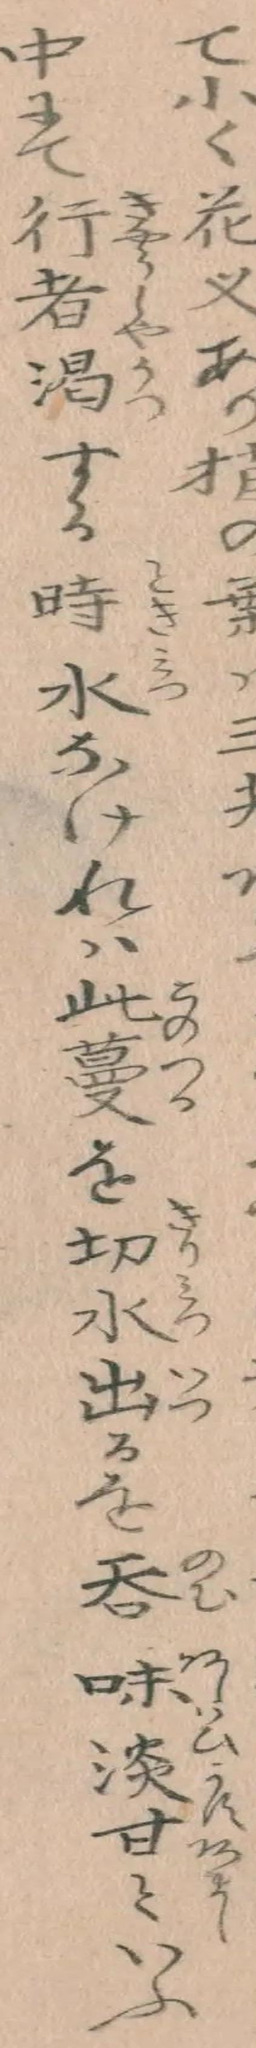中にて行者渇する時水なけれは此蔓を切水出るを呑味淡甘といふ
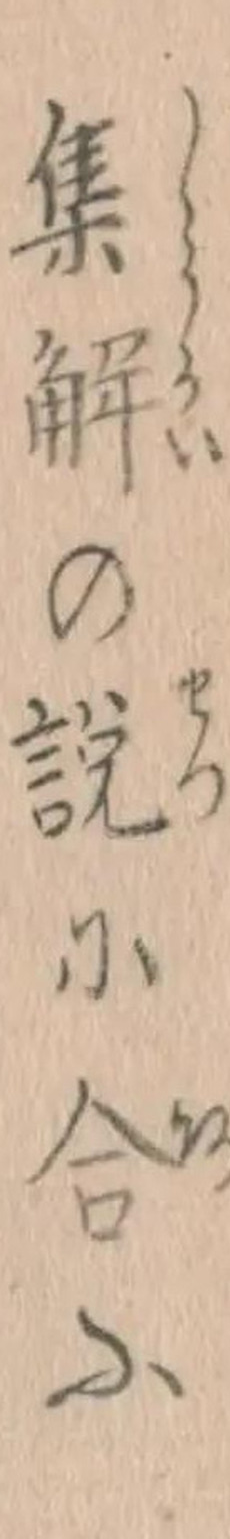集解の説に合ふ

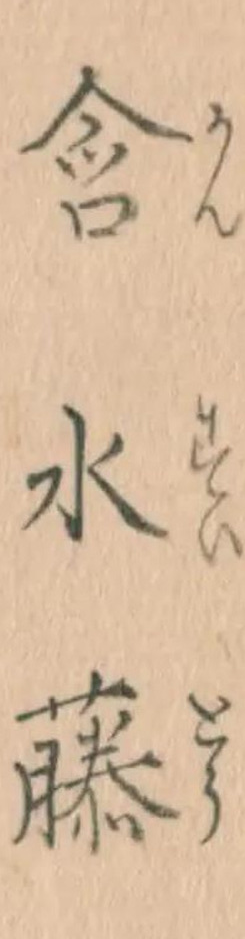含水藤
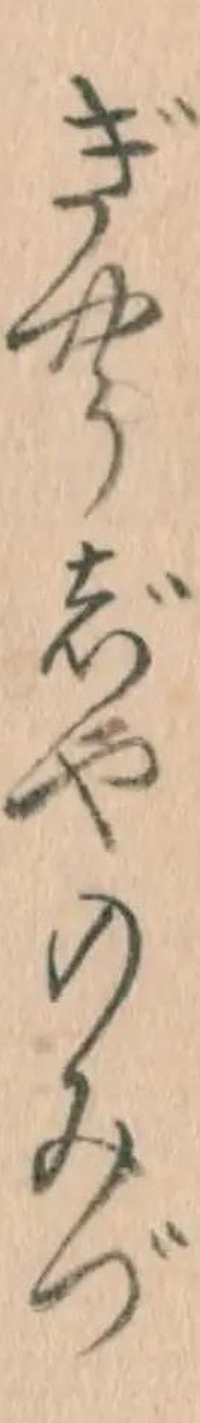ぎやうじやのみづ
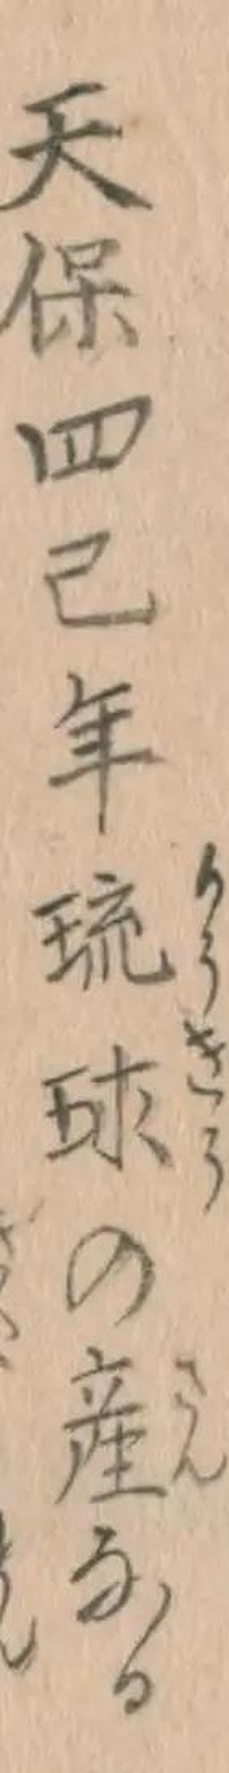天保四己年琉球の産なる
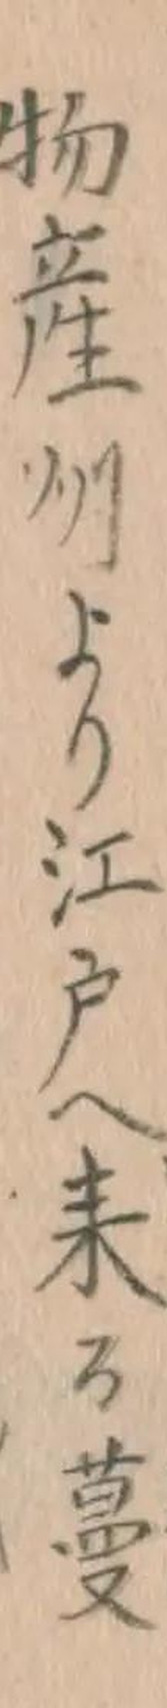物産州より江戸へ来る蔓
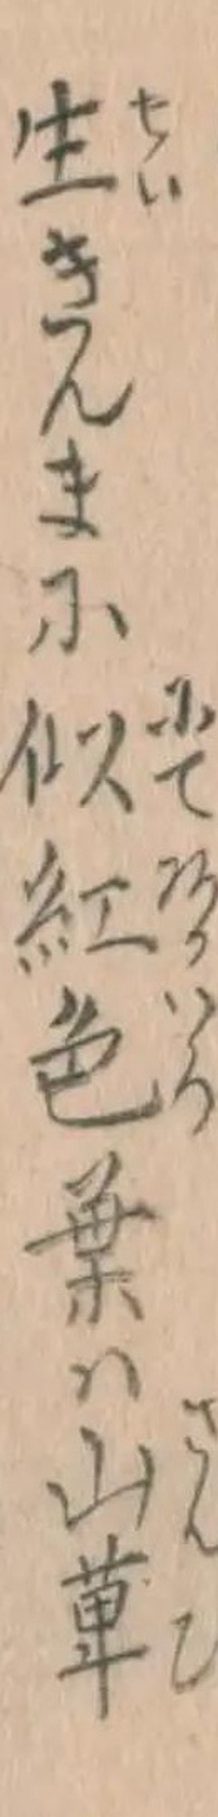生きんまに似紅色葉は山萆
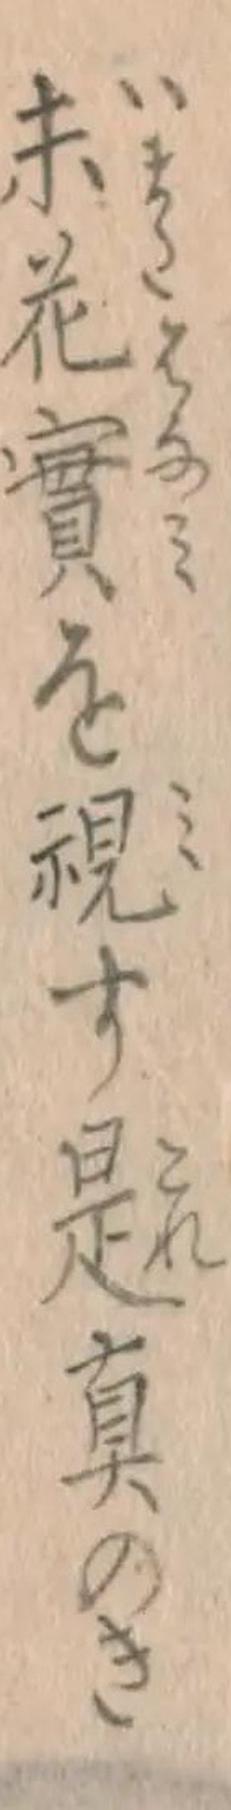未花実を視す是真のき
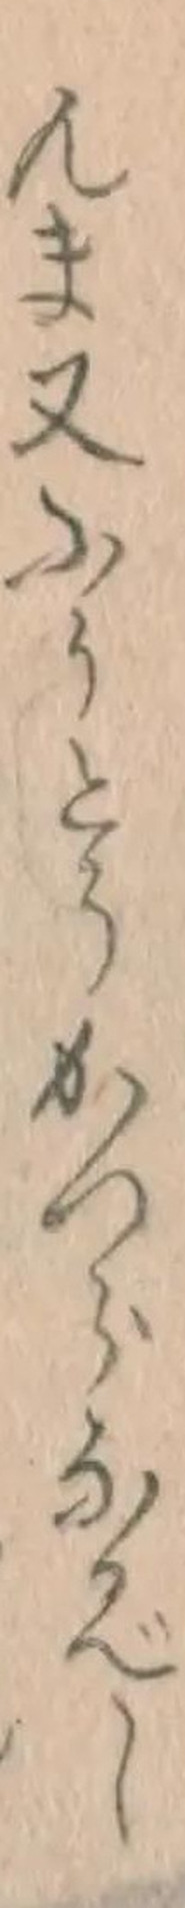んま又ふうとうかつらなるべし
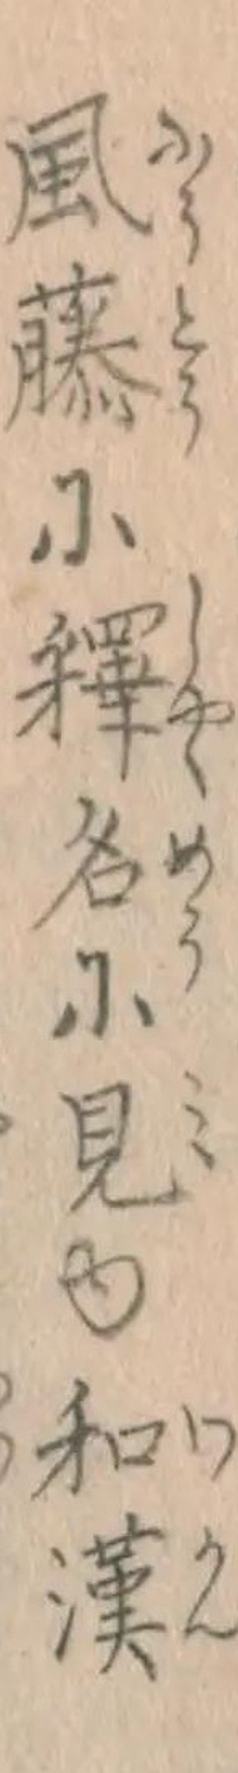風藤に釈名に見ゆ和漢
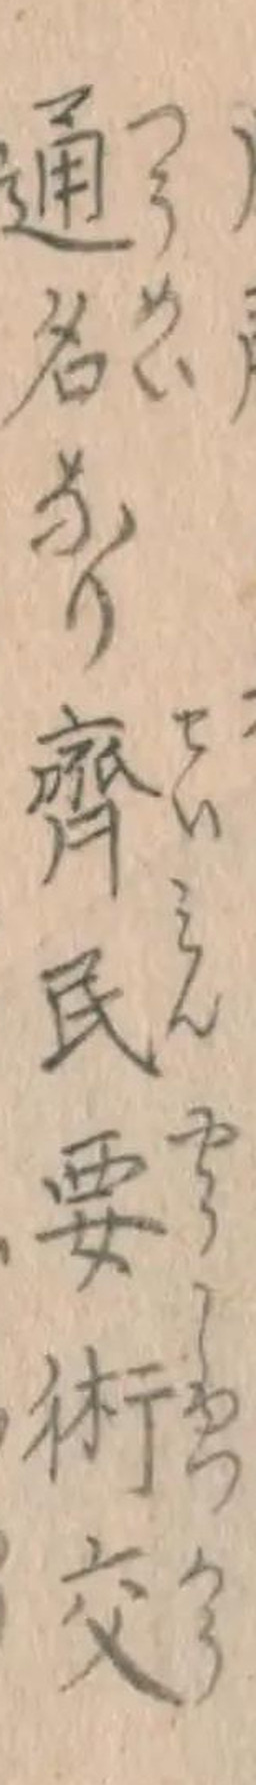通名なり斉民要術交
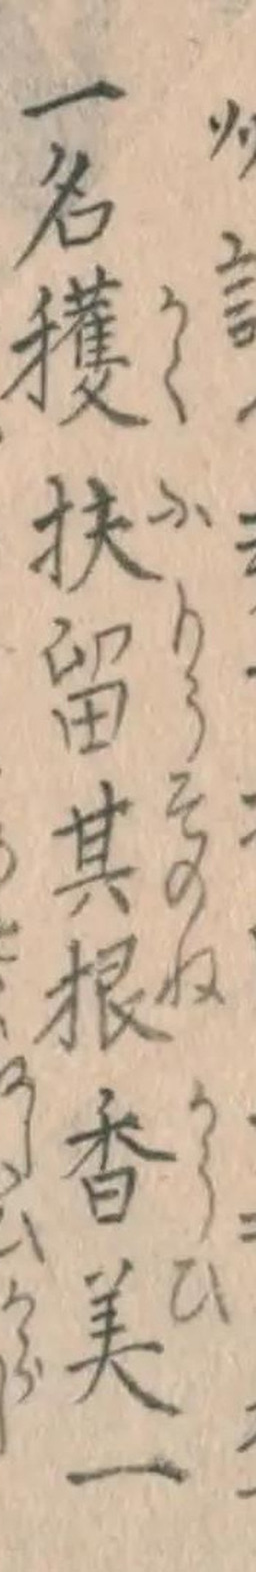一名穫扶留其根香美一
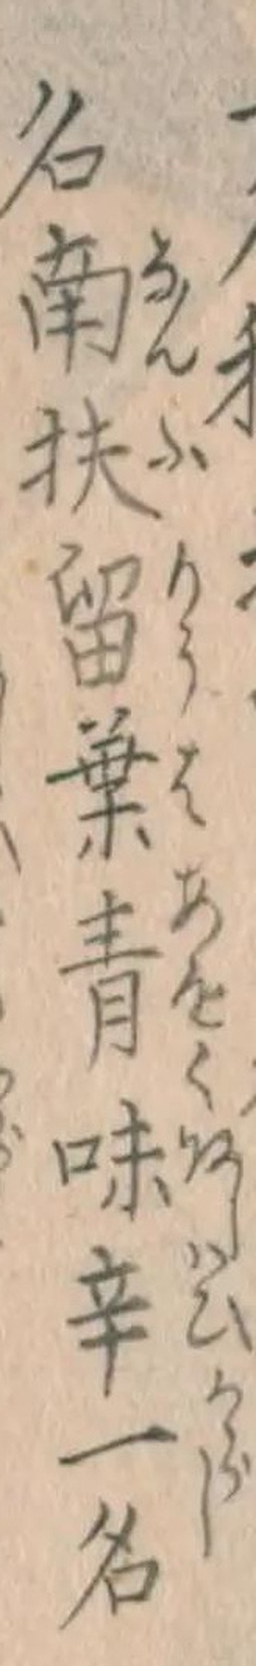名南扶留葉青味辛一名
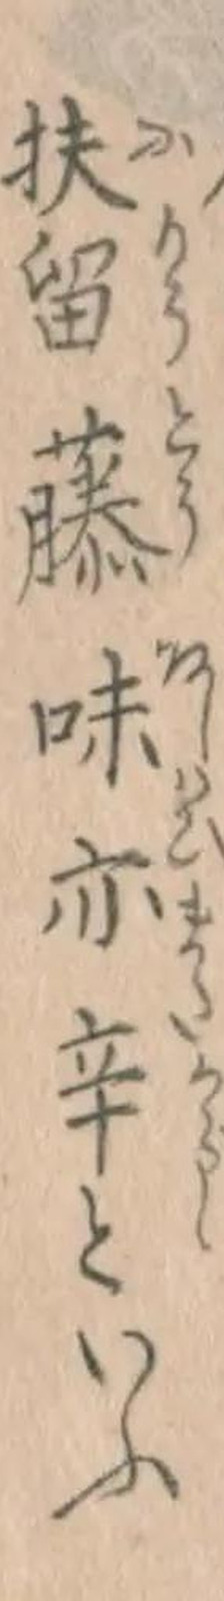扶留藤味亦辛といふ

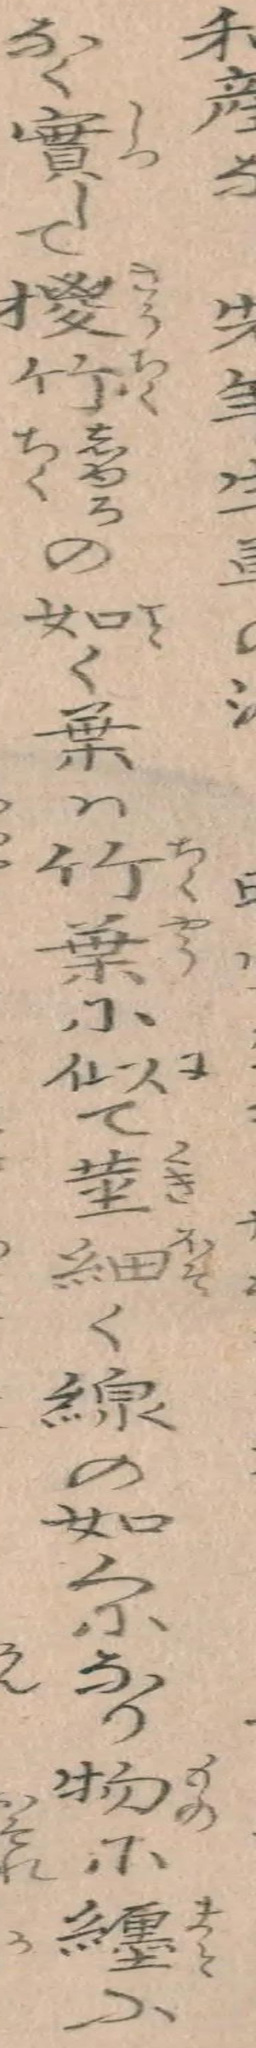なく実して棕竹しゆろちくの如く葉は竹葉に似て茎細く線の如くになり物に纏ふ
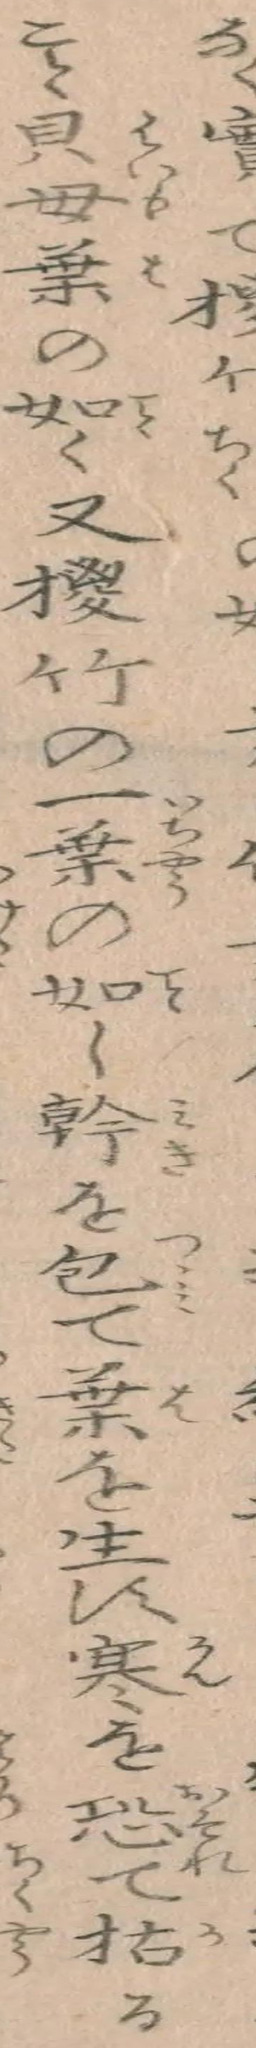こと貝母葉の如く又棕竹の一葉の如し幹を包て葉を生す寒を恐て枯る
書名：本草図譜. 巻31-33
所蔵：国立国会図書館 National Diet Library, JAPAN
